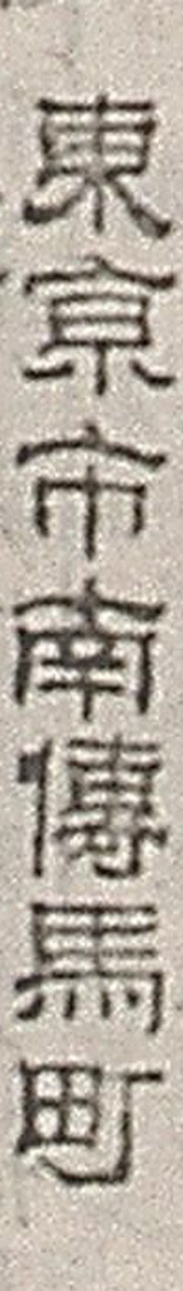東京市南伝馬町
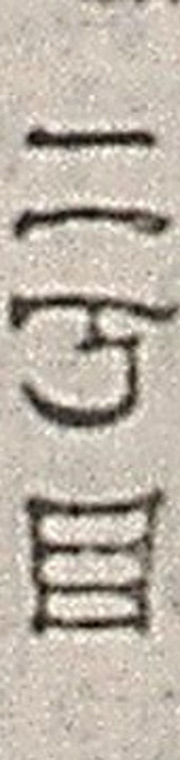二丁目
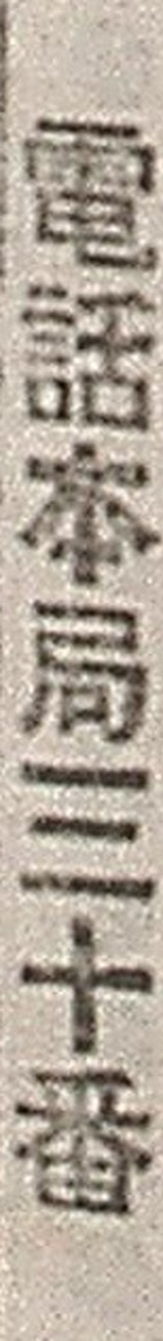電話本局三十番
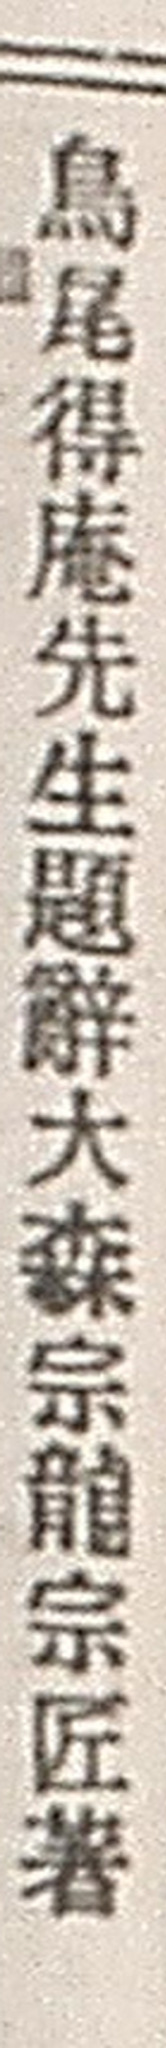鳥尾得庵先生題辞大森宗龍宗匠著
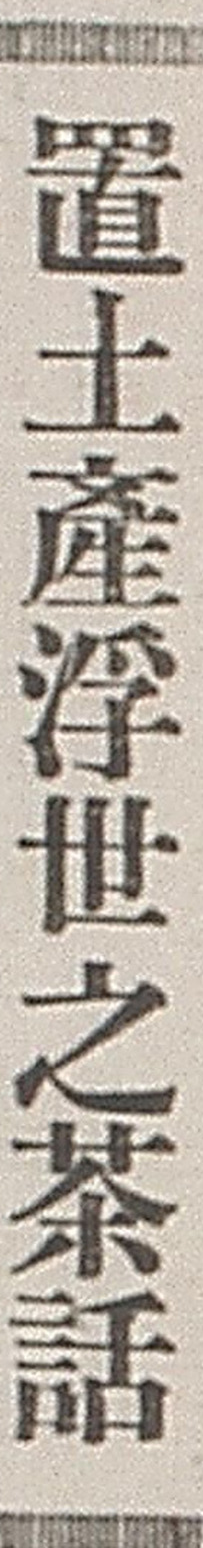置土産浮世之茶話
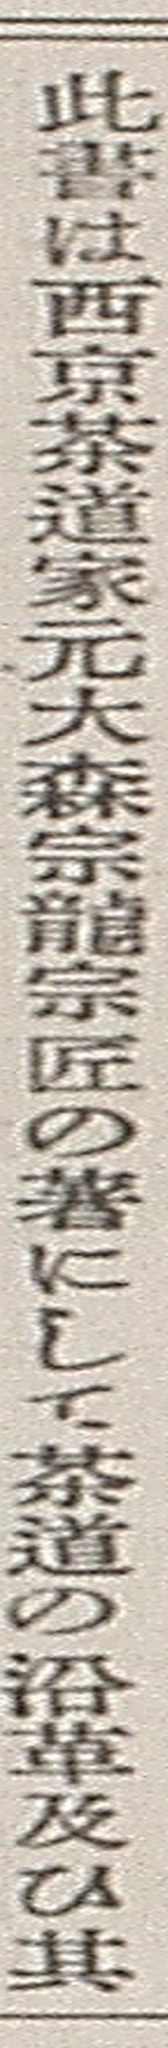此書は西京茶道家元大森宗龍宗匠の著にして茶道の沿革及ひ其
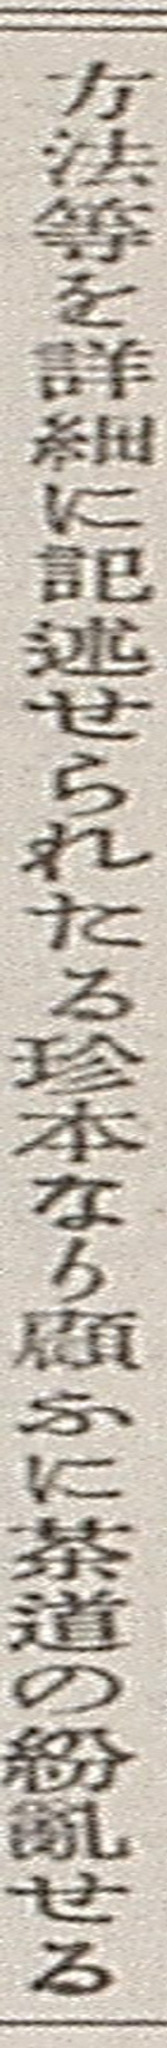方法等を詳細に記述せられたる珍本なり顧ふに茶道の紛乱せる
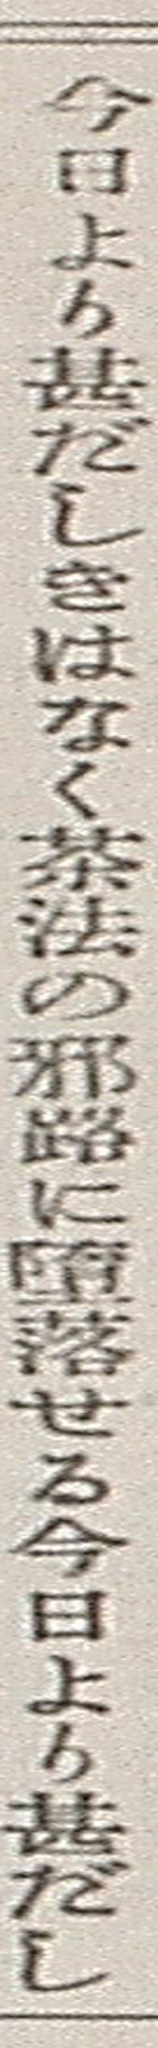今日より甚だしきはなく茶法の邪路に堕落せる今日より甚だし
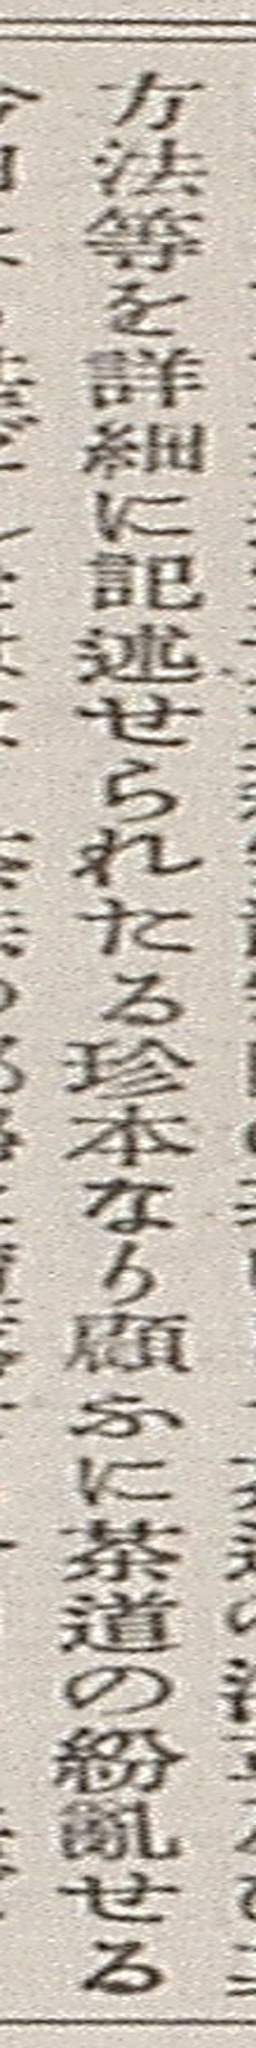方法等を詳細に記述せられたる珍本なり顧ふに茶道の紛乱せる
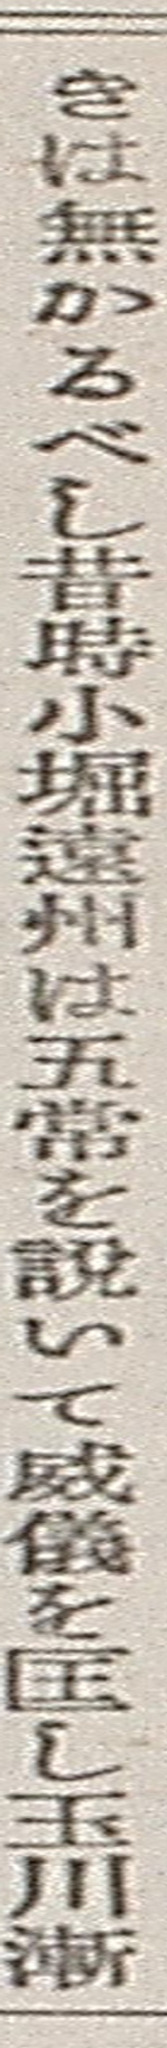きは無かるべし昔時小堀遠州は五常を説いて威儀を匡し玉川漸
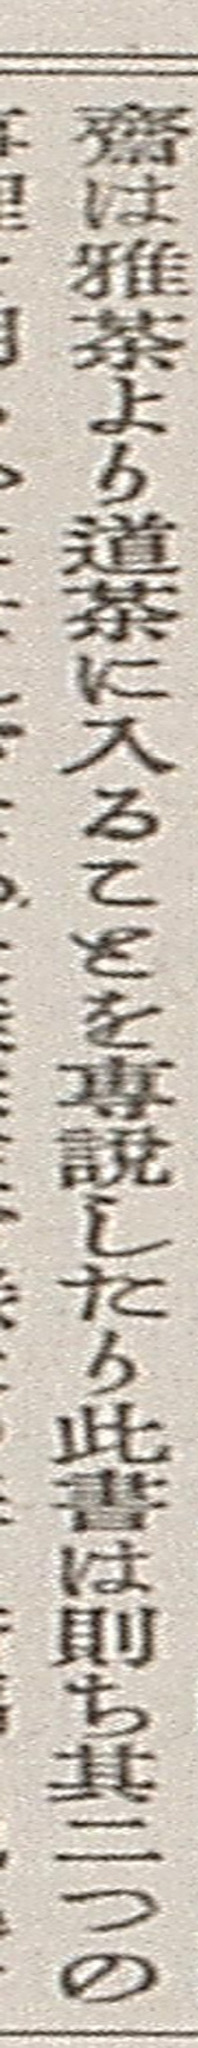斉は雅楽より道茶に入ることを専説したり此書は則ち其二つの
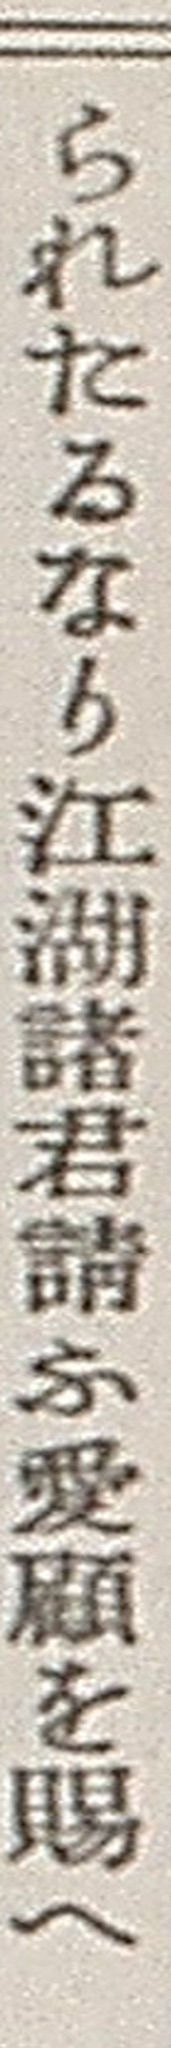られたるなり江湖諸君謂ふ愛顧を賜へ
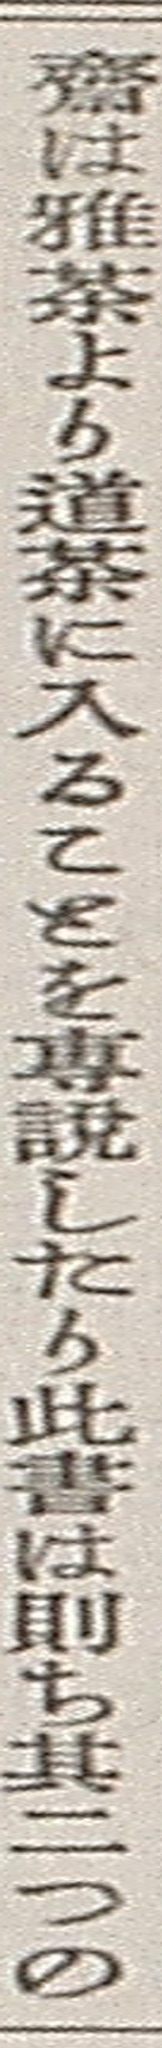斉は雅楽より道茶に入ることを専説したり此書は則ち其二つの
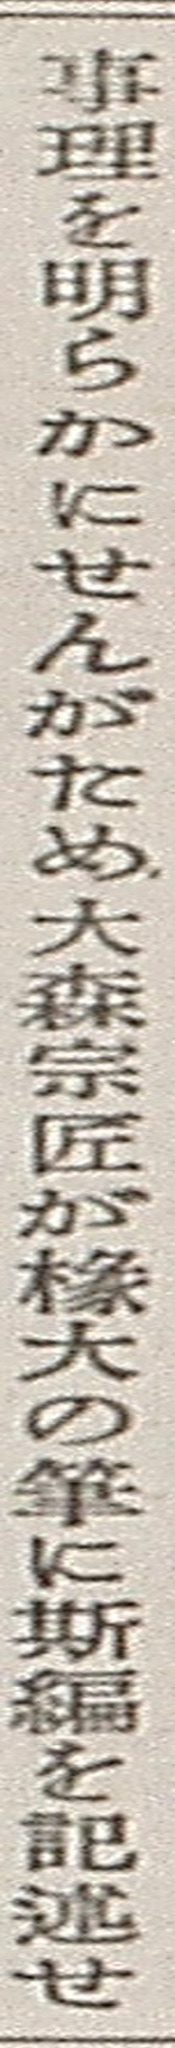事理を明らかにせんがため大森宗匠が椽大の筆に斯編を記述せ
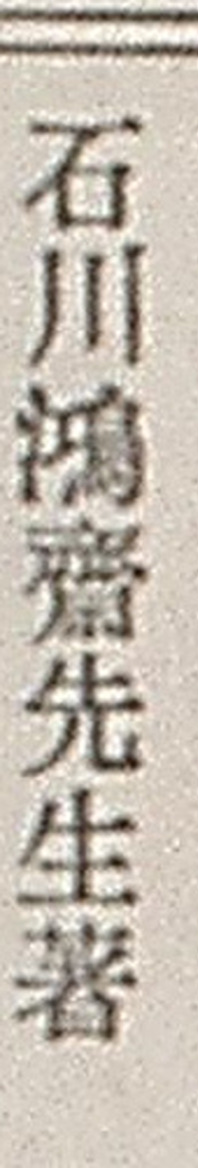石川鴻斉先生著
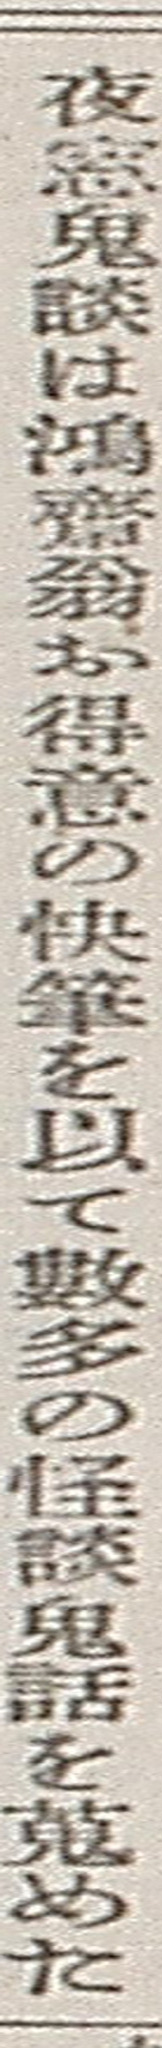夜窓鬼談は鴻斉翁お得意の快筆を以て数多の怪談鬼話を蒐めた
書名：風俗畫報臨時増刊第百九十九號　明治三十二年十月各地災害圖會（前編之續）
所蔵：東京大学地震研究所図書室 Earthquake Research Institute Library, The University of Tokyo, JAPAN
